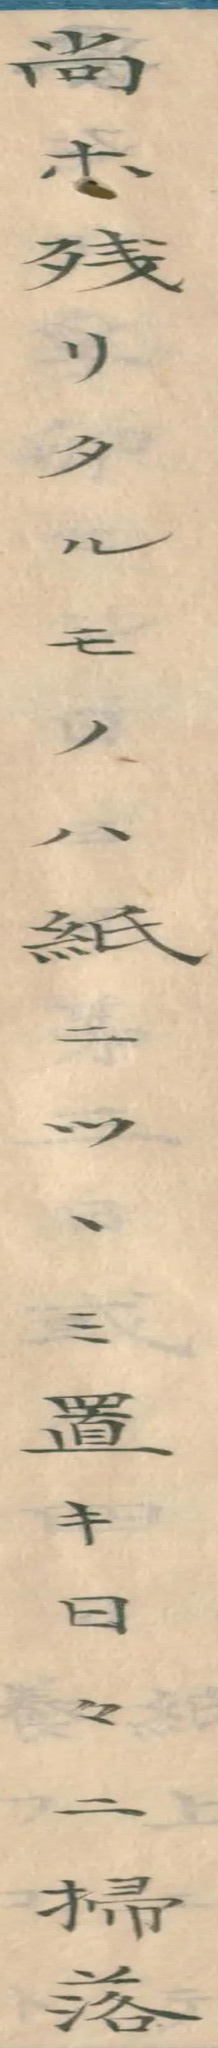尚ホ残リタルモノハ紙ニツヽミ置キ日々ニ掃落
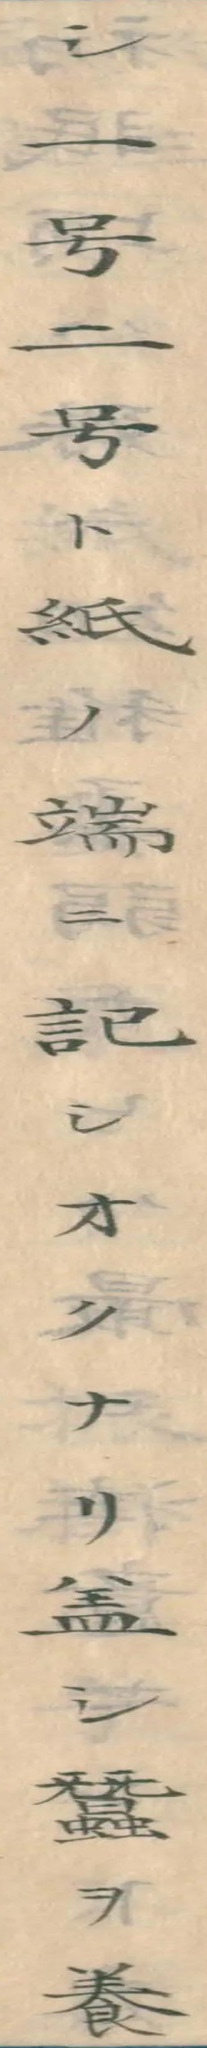シ一号二号ト紙ノ端ニ記シオクナリ蓋シ蚕ヲ養
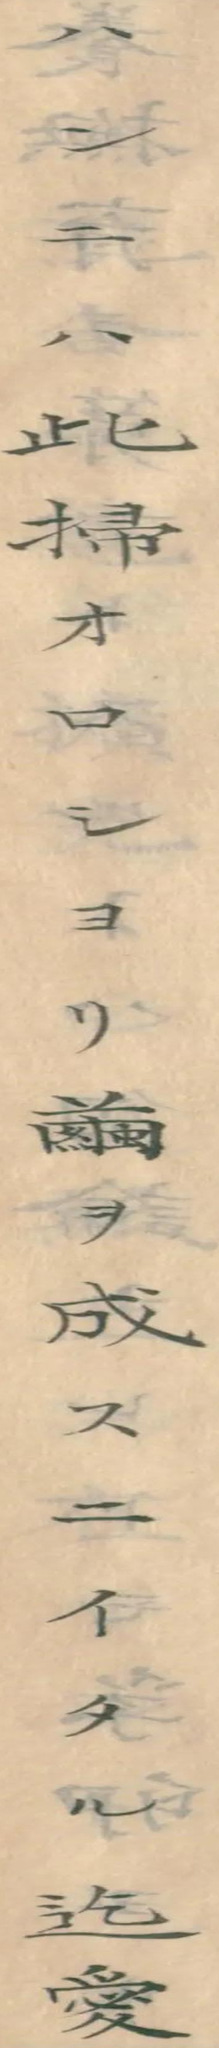ハンニハ此掃オロシヨリ繭ヲ成スニイタル迄愛

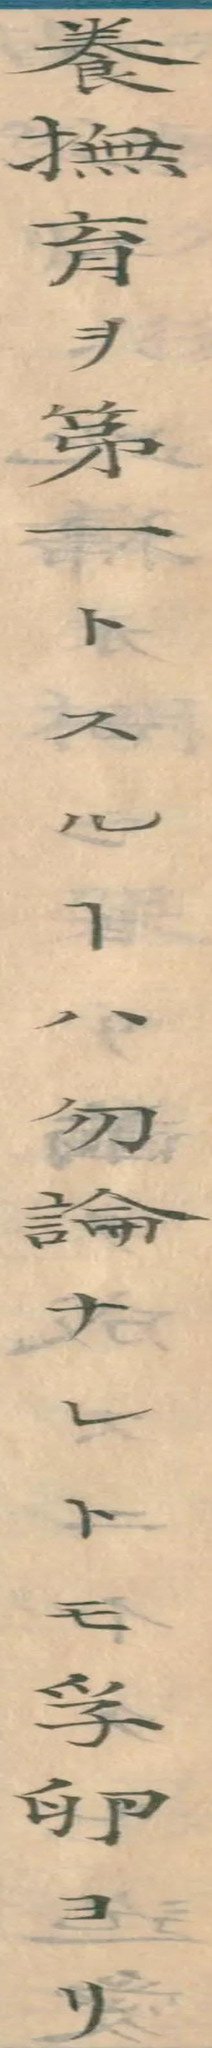養撫育ヲ第一トスルコトハ勿論ナレトモ孚卵ヨリ
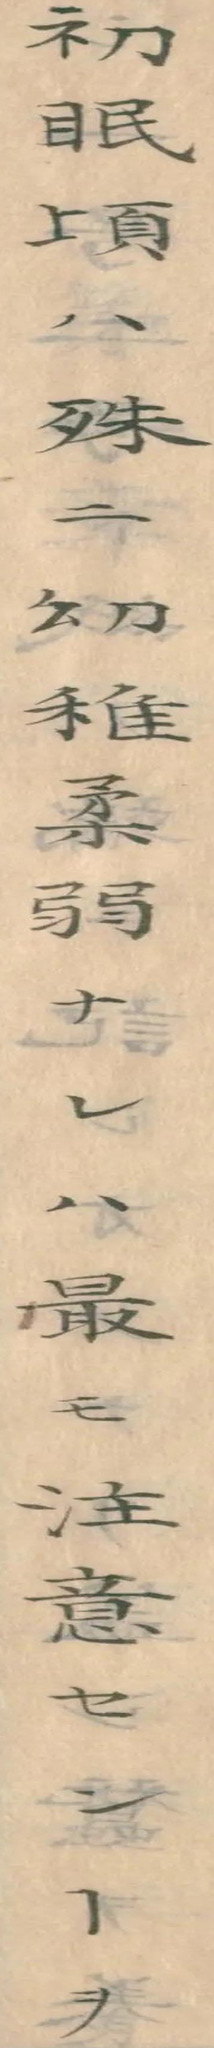初眠頃ハ殊ニ幼稚柔弱ナレハ最モ注意センコトヲ
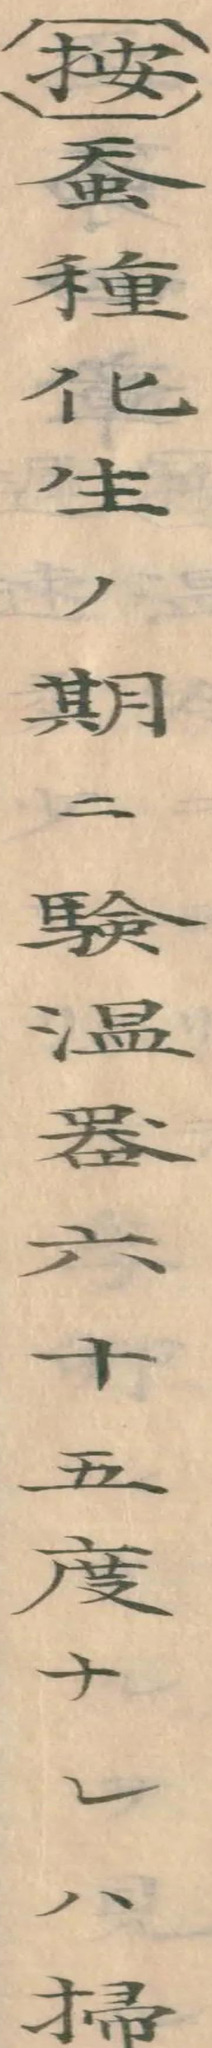[按]蚕種化生ノ期ニ験温器六十五度ナレハ掃
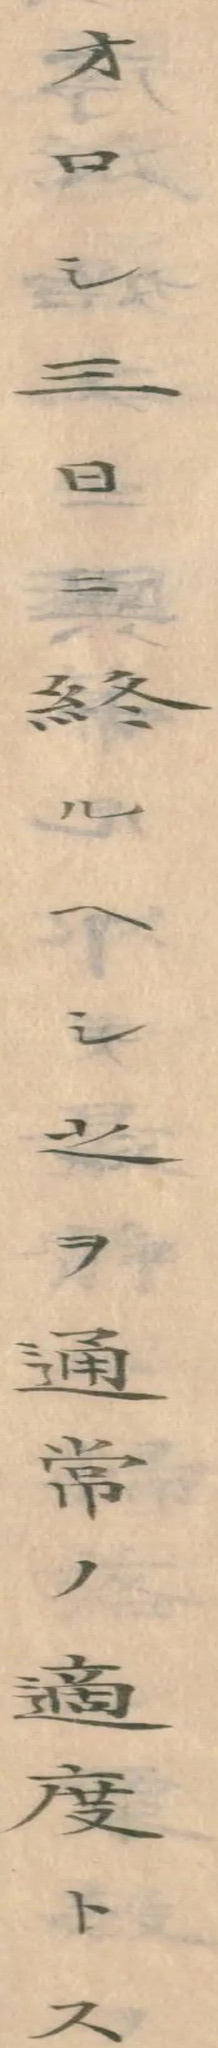オロシ三日ニ終ルヘシ之ヲ通常ノ適度トス
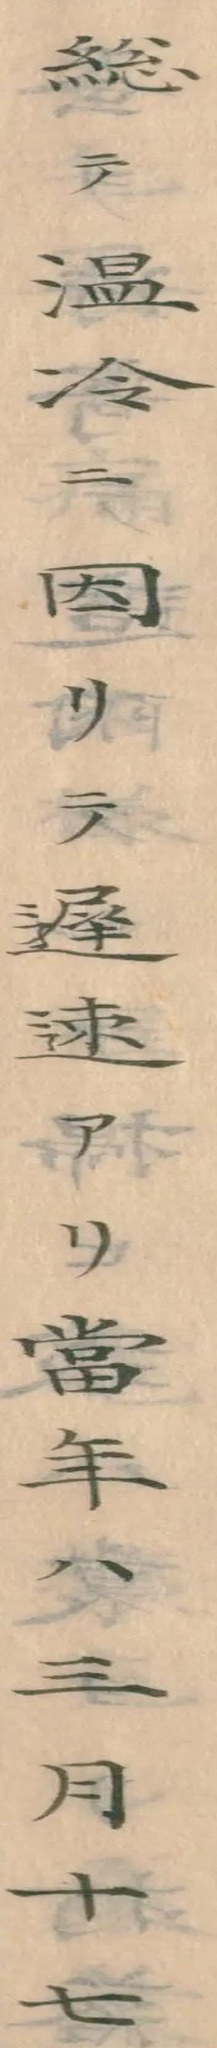総テ温冷ニ因リテ遅速アリ当年ハ三月十七
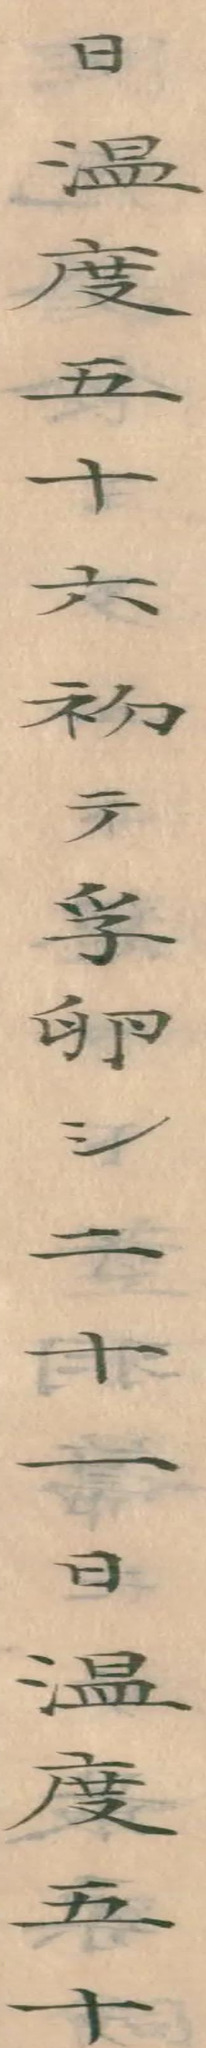日温度五十六初テ孚卵シ二十一日温度五十
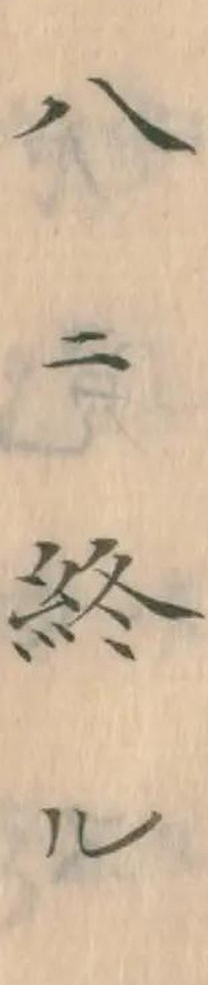八ニ終ル
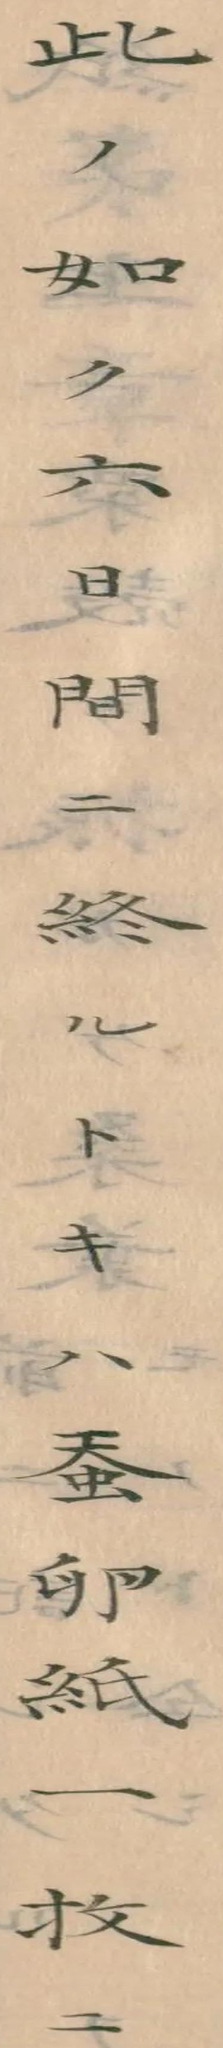此ノ如ク六日間ニ終ルトキハ蚕卵紙一枚ニ
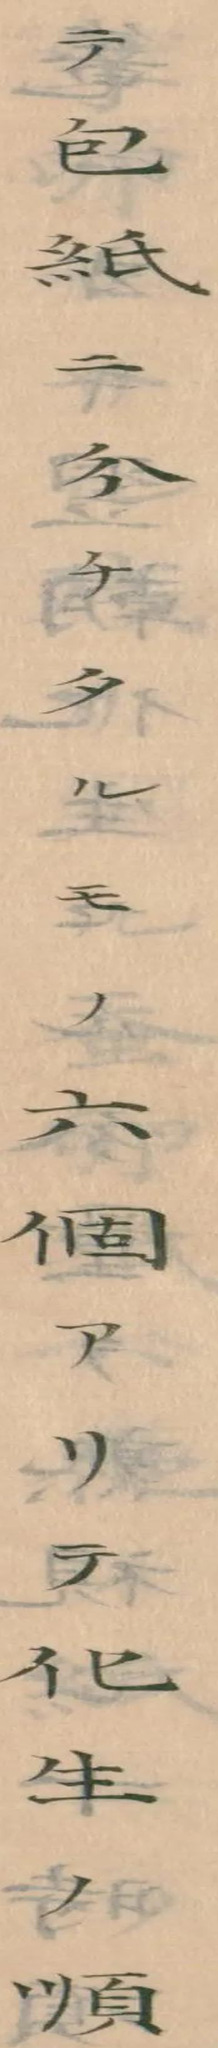テ包紙ニ分チタルモノ六個アリテ化生ノ順
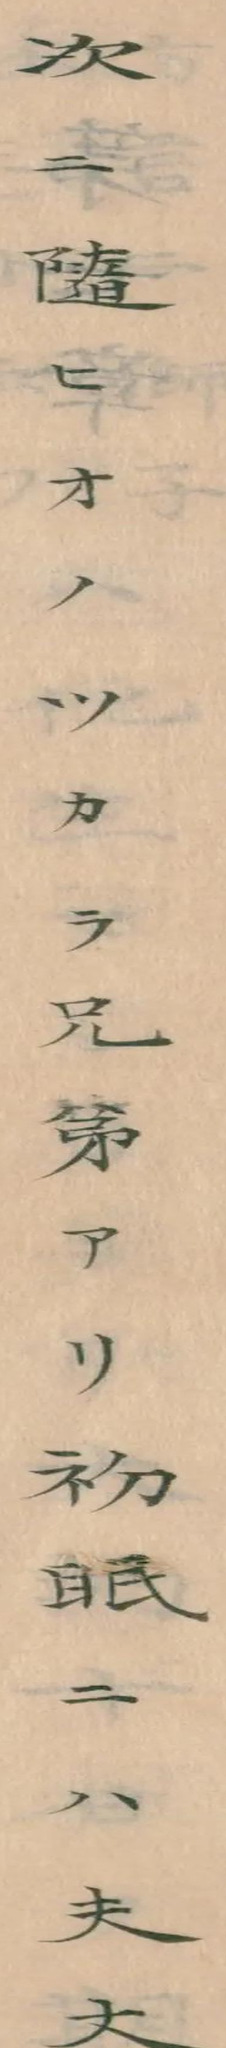次ニ随ヒオノツカラ兄弟アリ初眠ニハ夫大
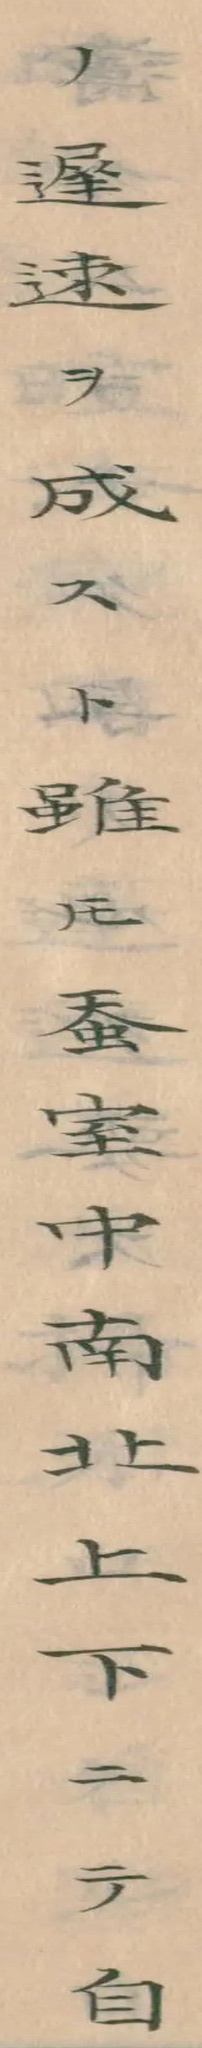ノ遅速ヲ成スト雖トモ蚕室中南北上下ニテ自
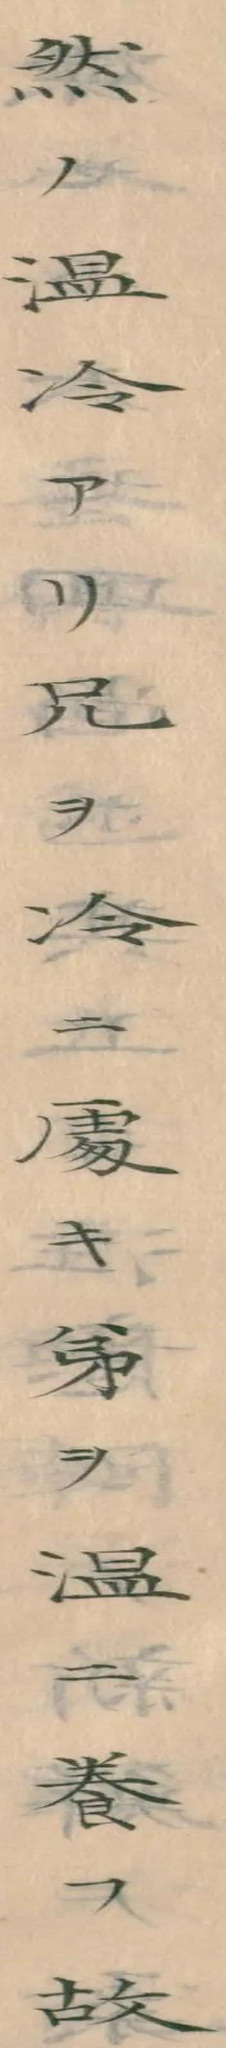然ノ温冷アリ兄ヲ冷ニ処キ弟ヲ温ニ養フ故
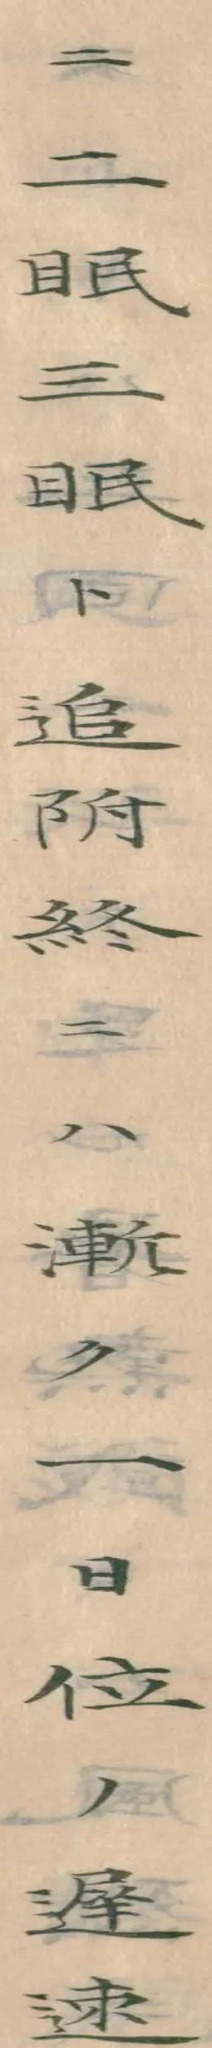ニ二眠三眠ト追附終ニハ漸ク一日位ノ遅速
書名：蚕桑集成
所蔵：国立国会図書館 National Diet Library, JAPAN
